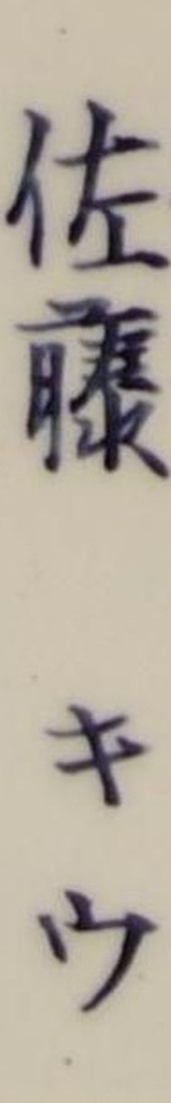佐藤キウ
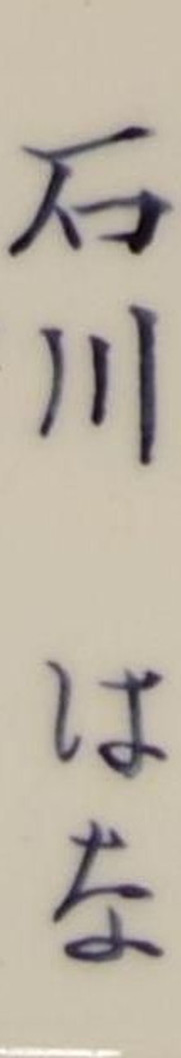石川はな
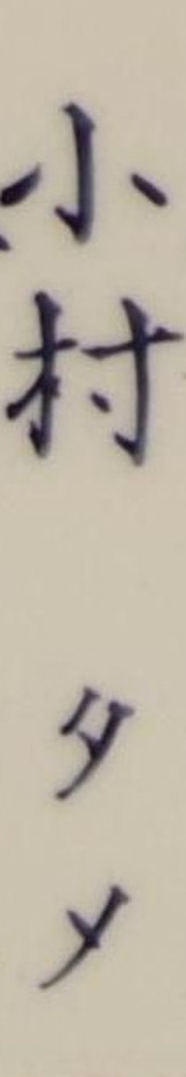小村タメ
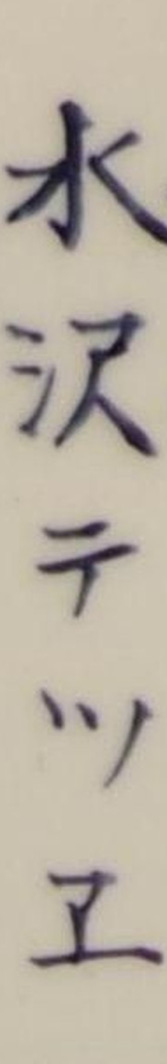水沢テツエ
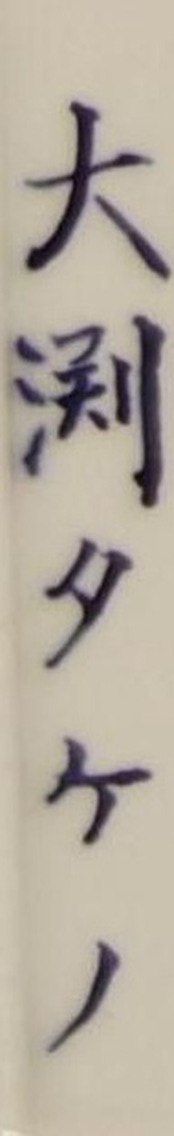大洲タケノ

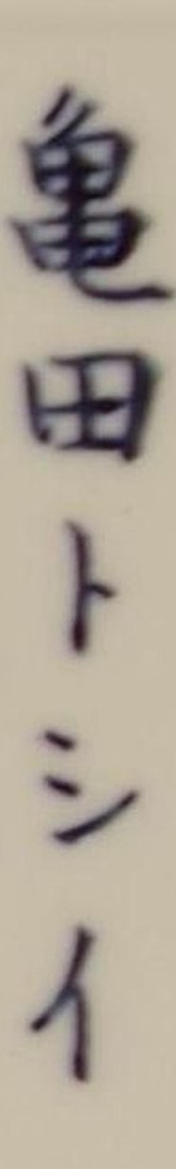亀田トシイ
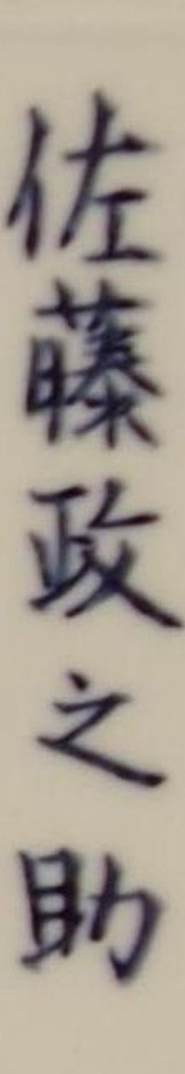佐藤政之助
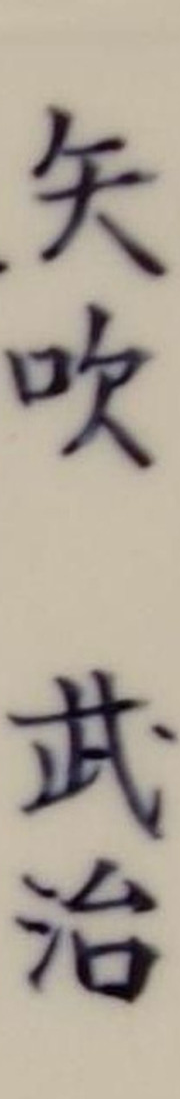矢吹武治
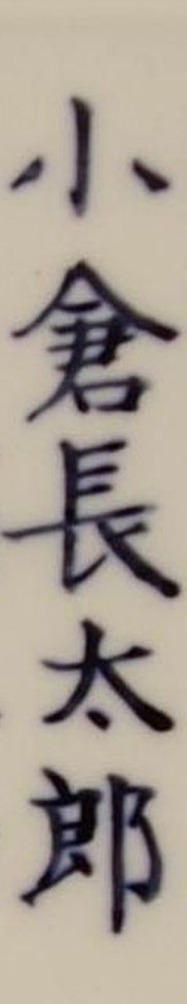小倉長太郎
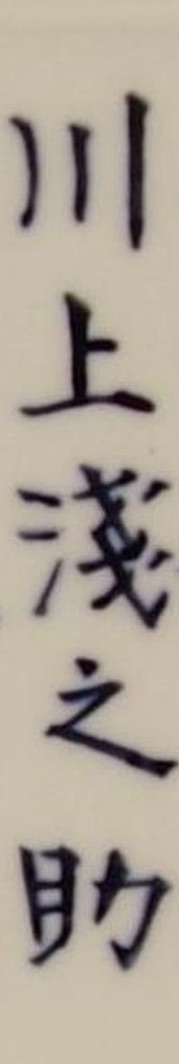川上浅之助
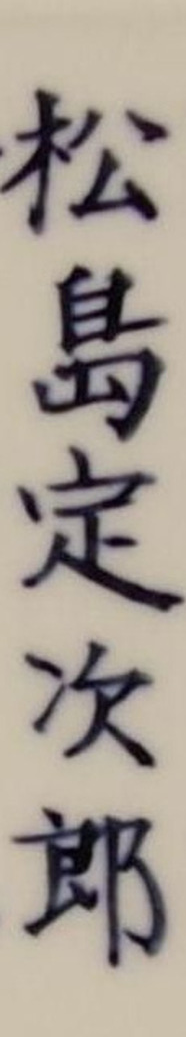松島定次郎
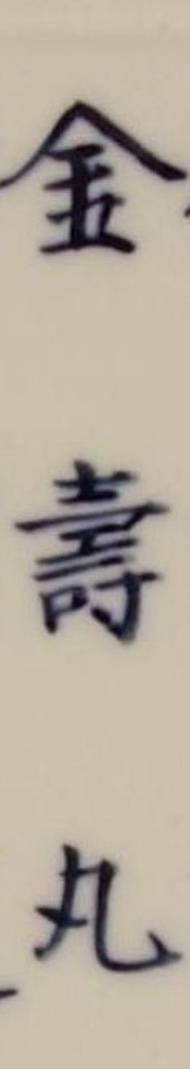金壽丸
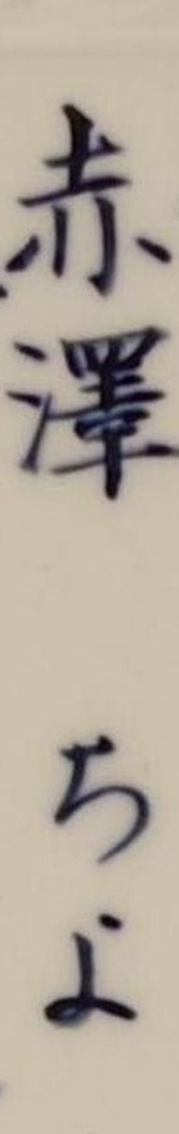赤澤ちよ
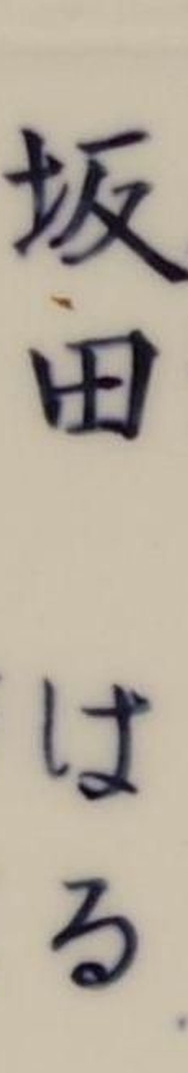坂田はる
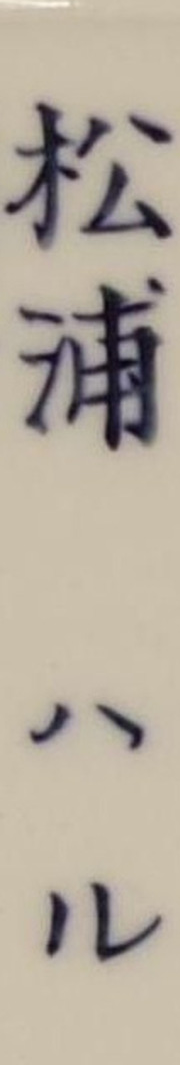松浦ハル
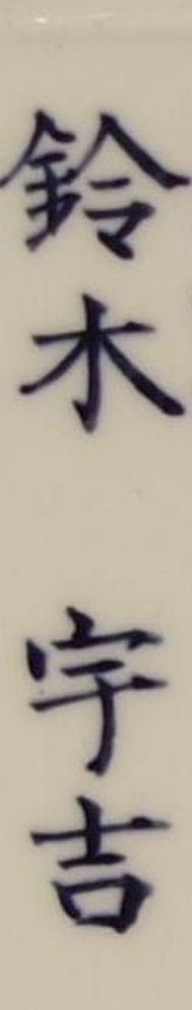鈴木宇吉
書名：M~S
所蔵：高野山金剛峯寺
